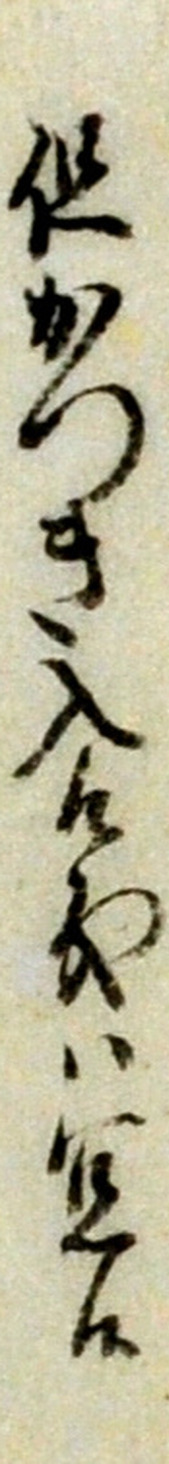但かつき入候義ハ宜候
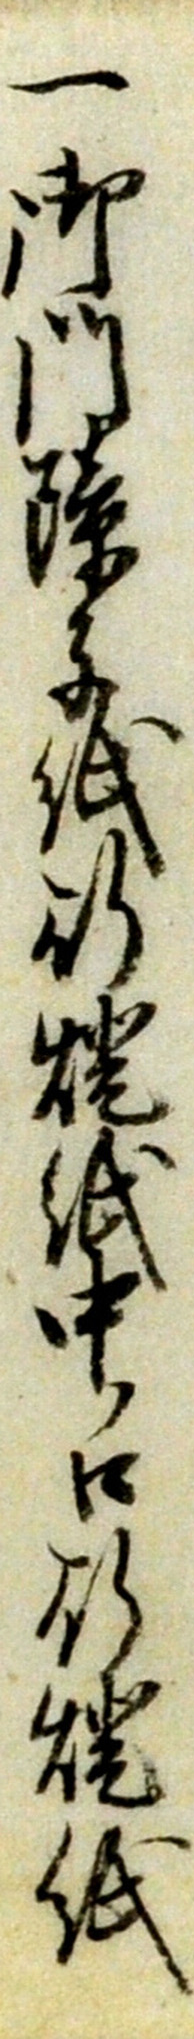一御門障子紙行燈紙中ノ口行燈紙
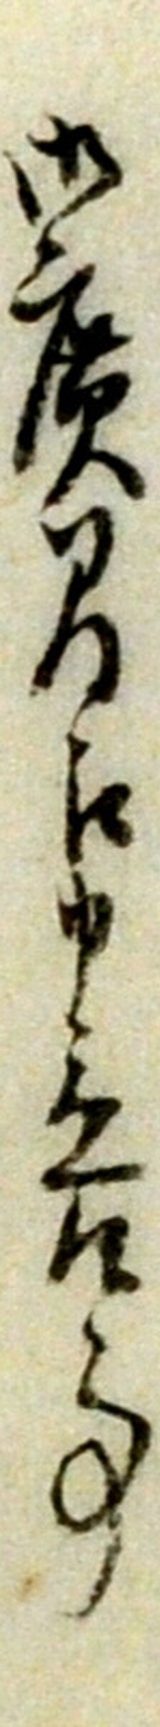御広間江申立候事
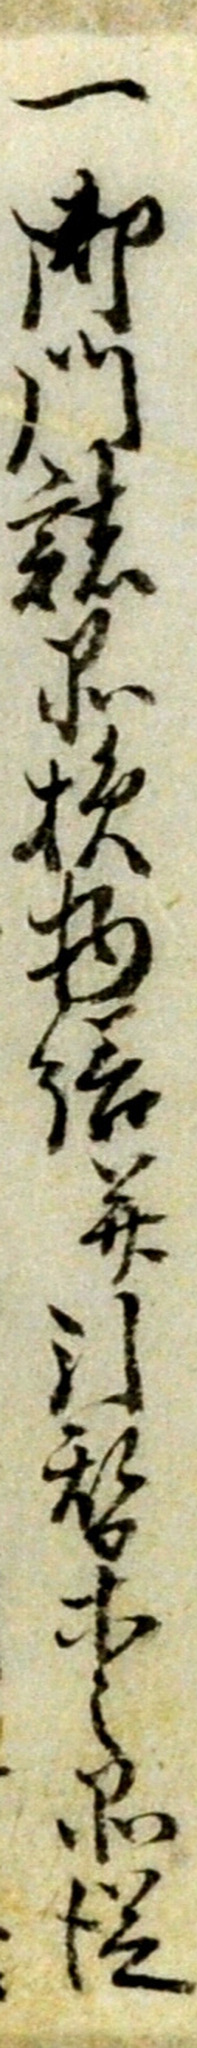一御門諸品様物繕并引替等之品従
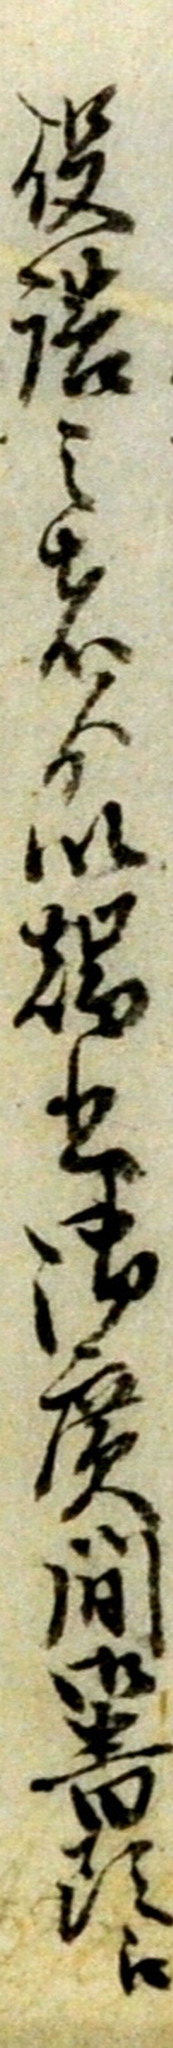役詰之者ゟ御端書御広間御番頭江
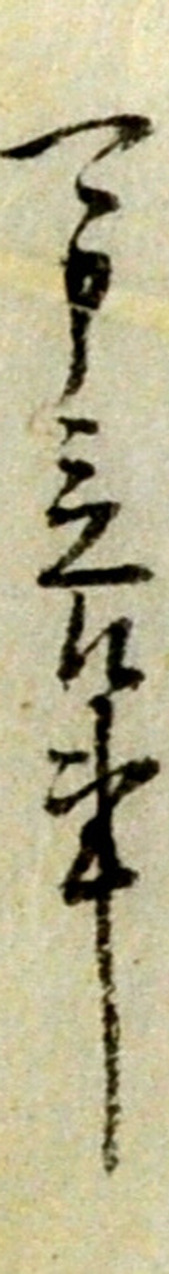可申立候事

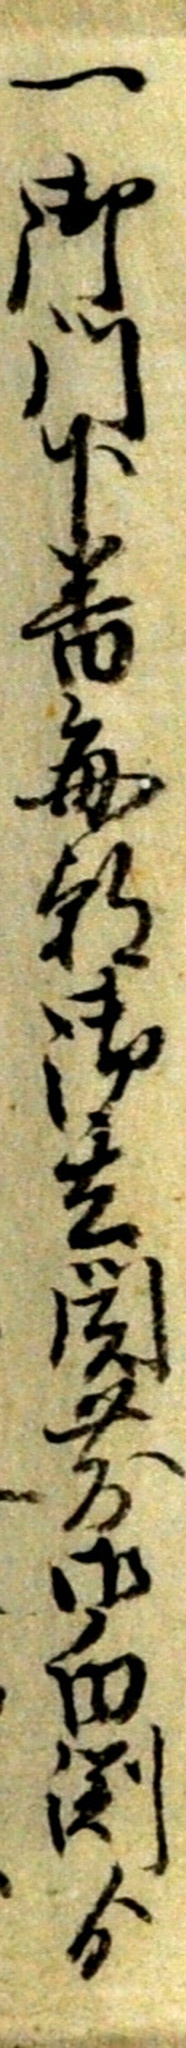一御門下番毎朝御玄関前御白渕ゟ
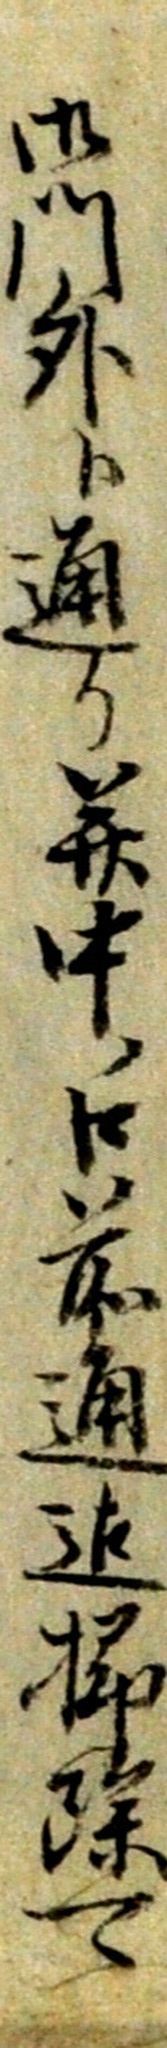御門外ト通り并中ノ口前通迄掃除可
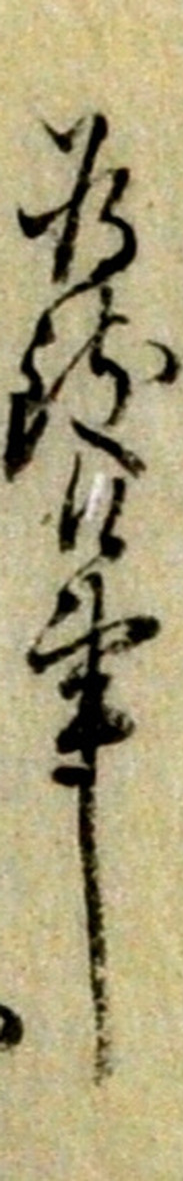為致候事
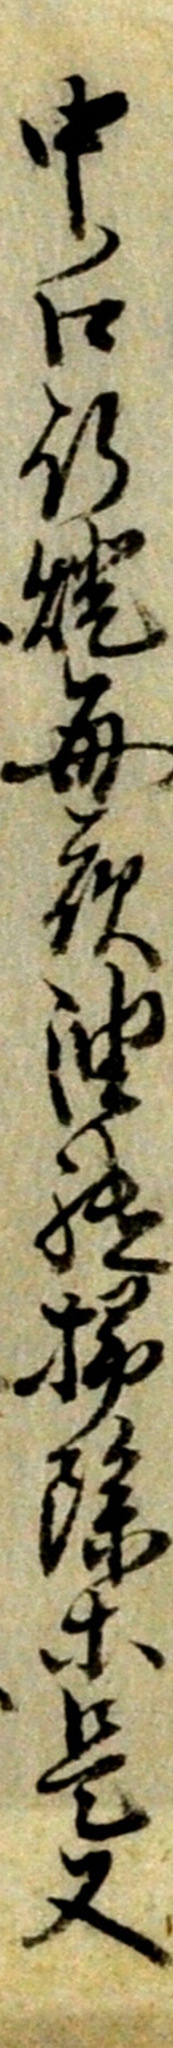中ノ口行燈毎夜油継掃除等是又
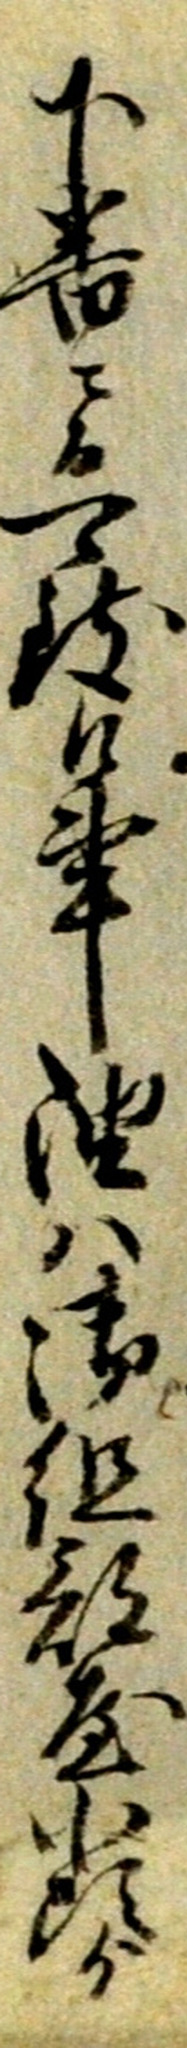下番ニ而可致候事油ハ御組部屋小頭ゟ
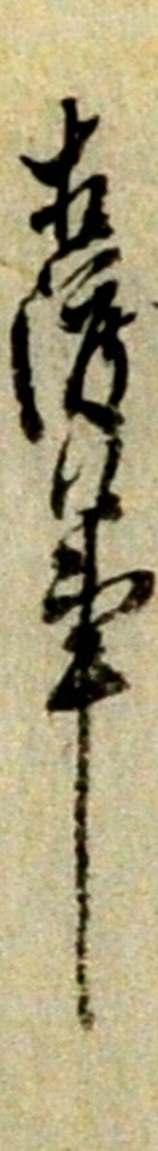相渡候事
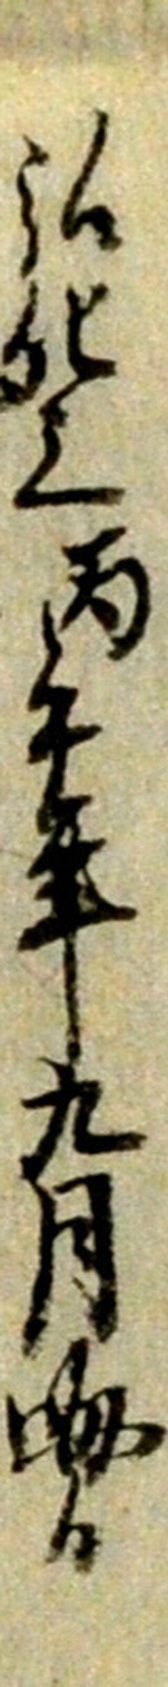弘化三丙午年九月晦日
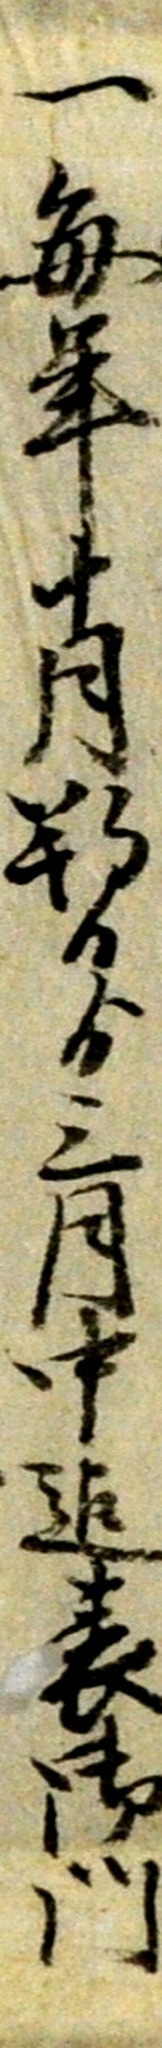一毎年十月朔日ゟ三月中迄表御門
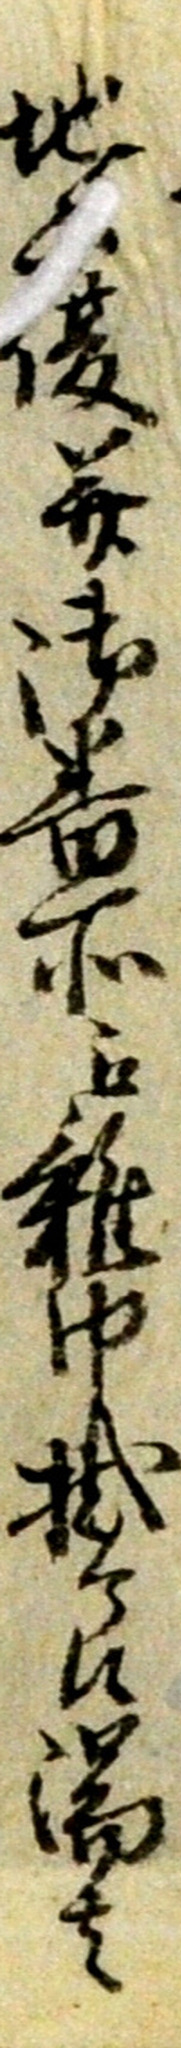地復并御番所江雑巾掛ケ候湯者
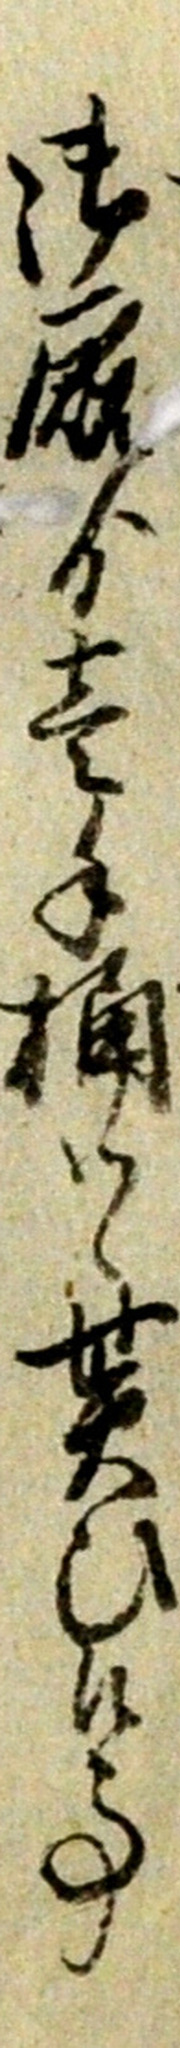御厩ゟ壱手桶ツヽ貰い候事
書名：御先手組江戸御屋敷御門番勤方
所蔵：伊那市立高遠町図書館・合同会社AMANE
